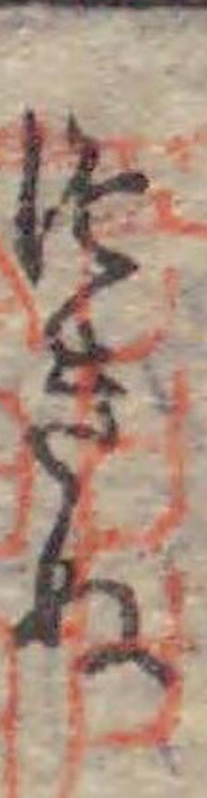つきぬ

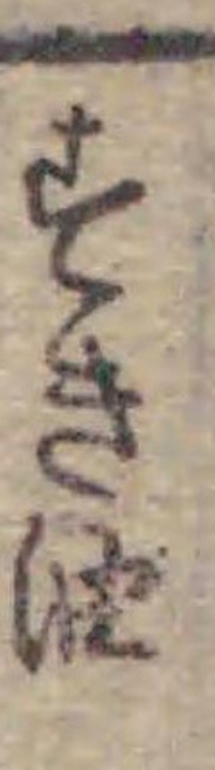すき油
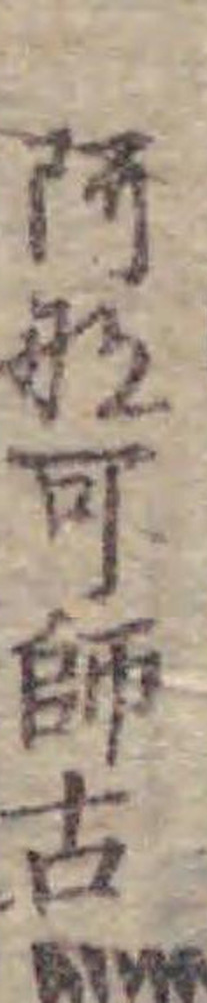阿な可師古
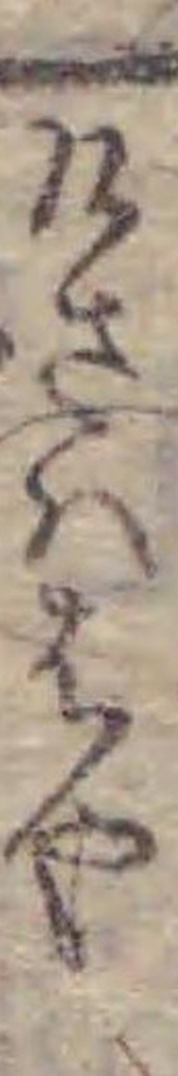けさははや
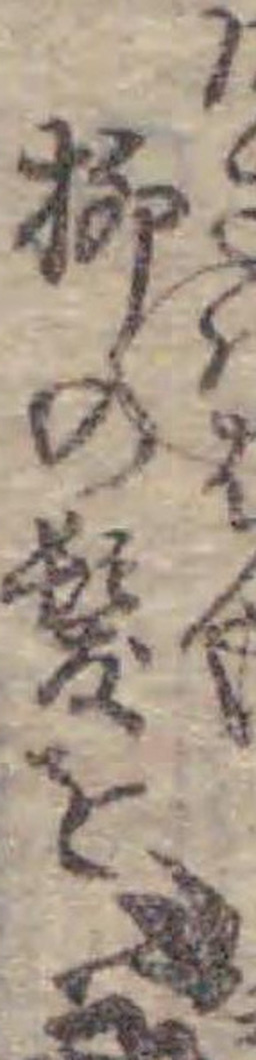柳の髪を
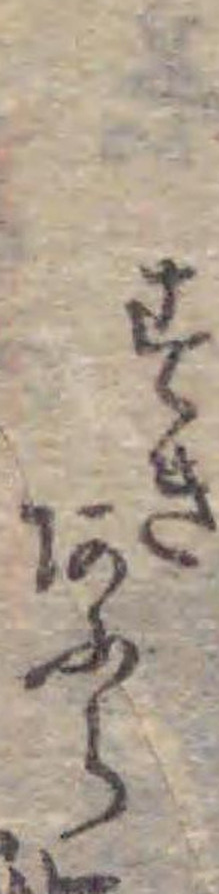あふら
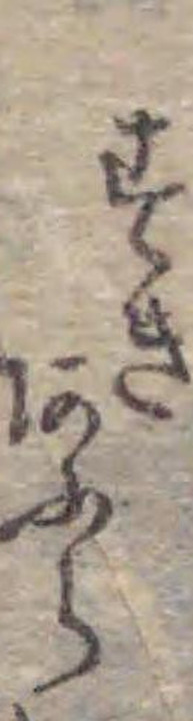あふら
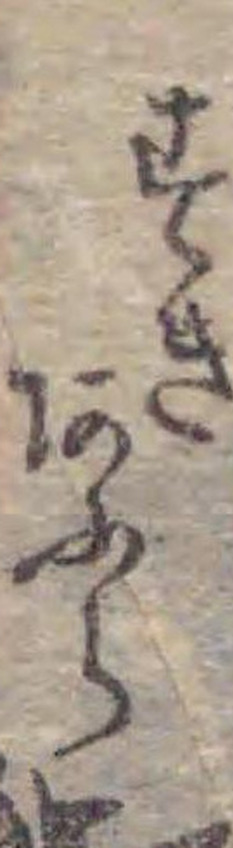あふら
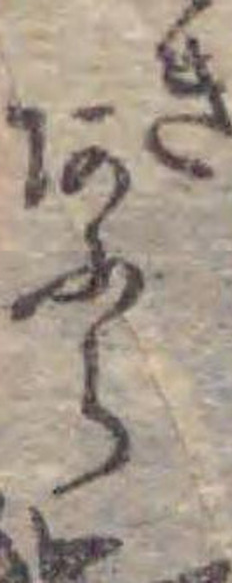あふら
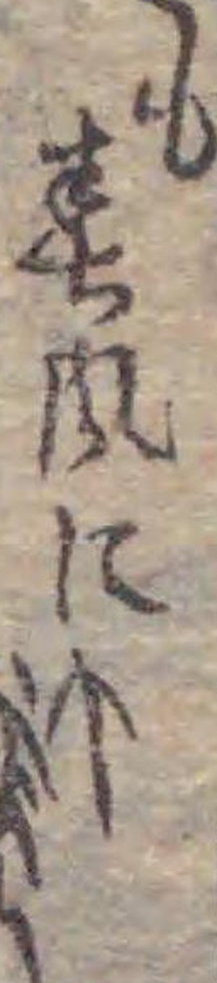春風に
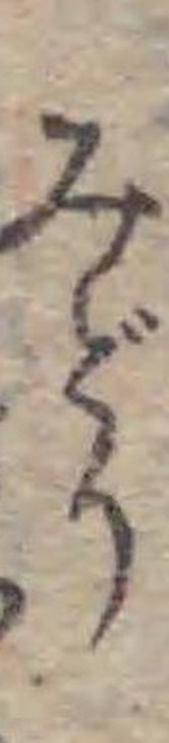みどり
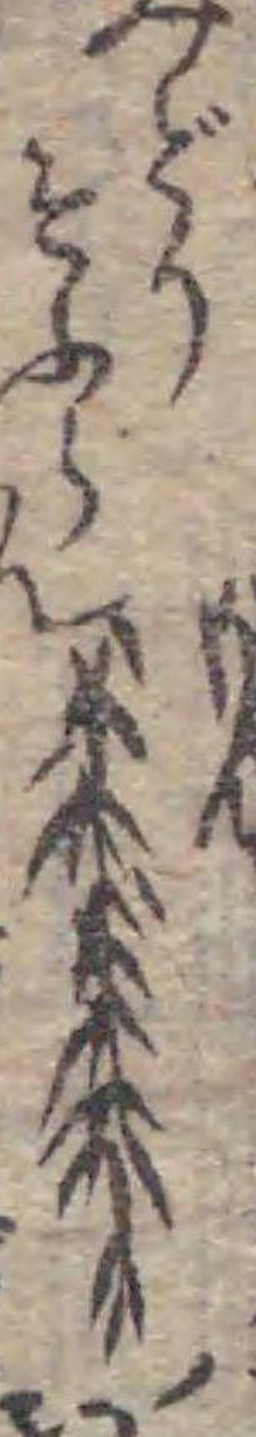そふらん
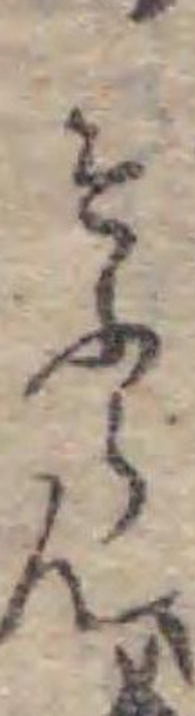そふらん
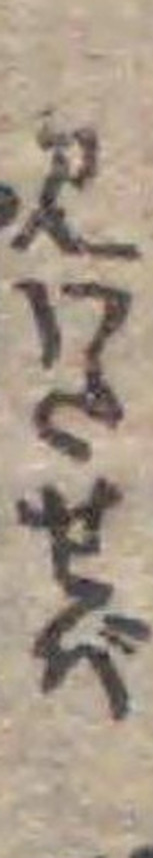見わたせば
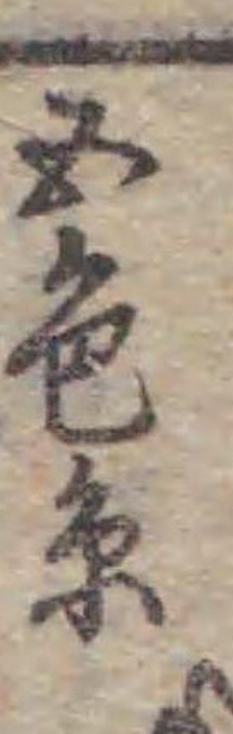五色糸
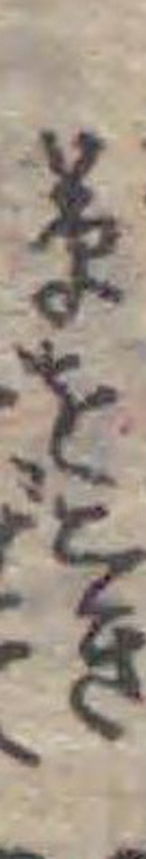草をこき
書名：年始御礼帳 : 3巻
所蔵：国立国会図書館 National Diet Library, JAPAN
